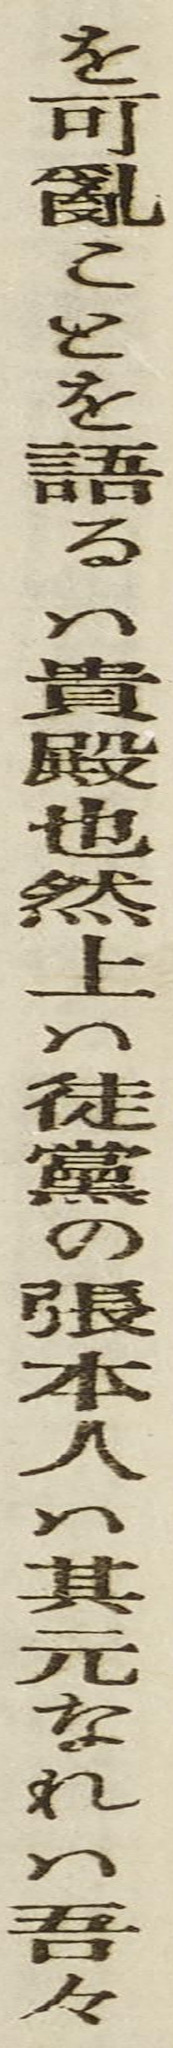を可乱ことを語るは貴殿也然上は徒党の張本人は其元なれは吾々
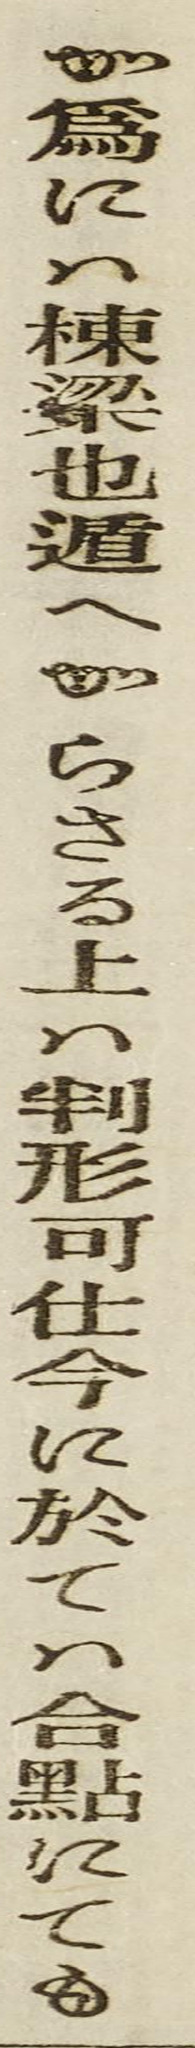か為には棟梁也遁へからさる上は判形可仕今に於ては合点にても
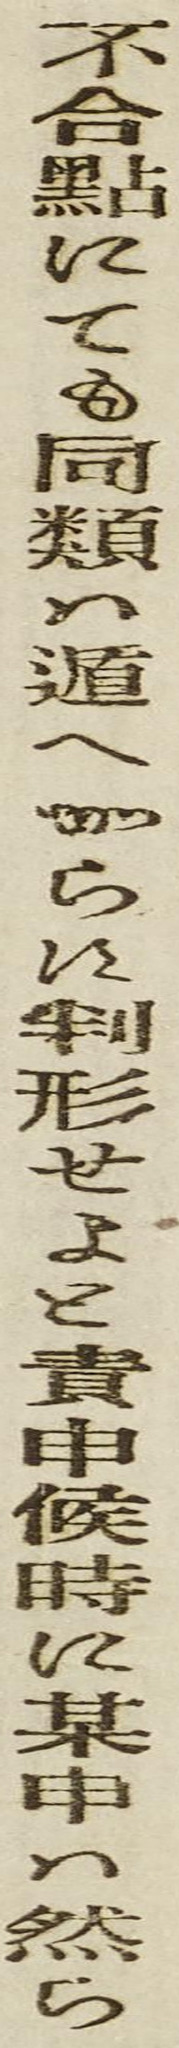不合点にても同類は遁へからす判形せよと責申候時に某申は然ら
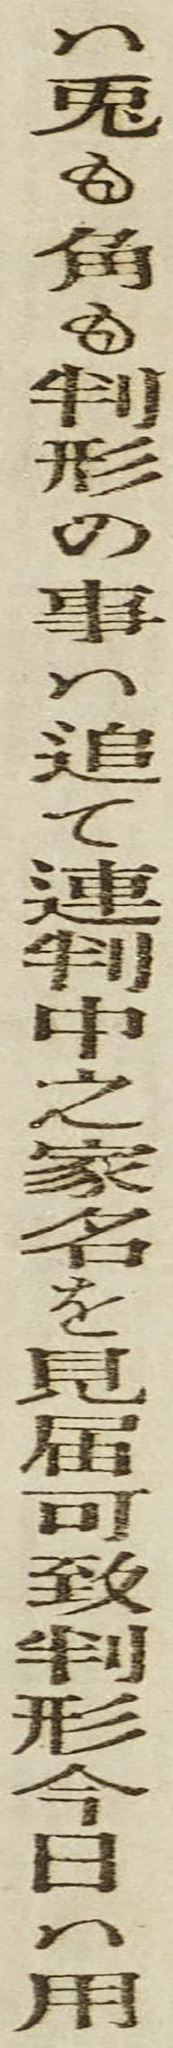は兎も角も判形の事は追て連判中之家名を見届可致判形今日は用

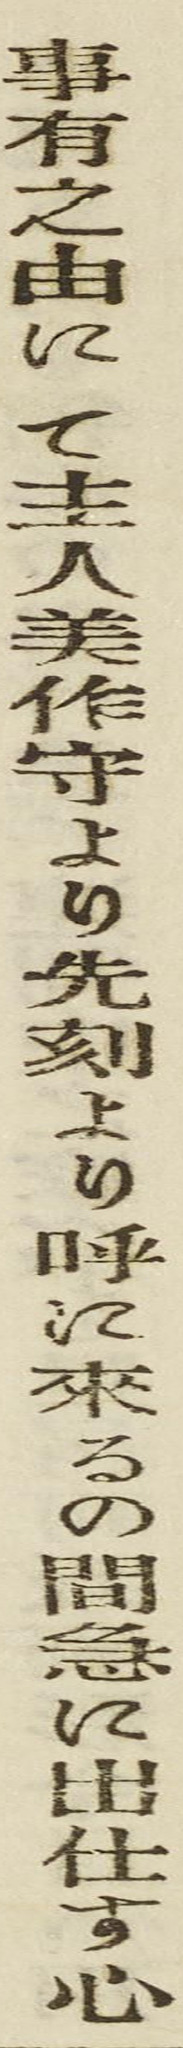事有之由にて主人美作守より先刻より呼に来るの間急に出仕す心
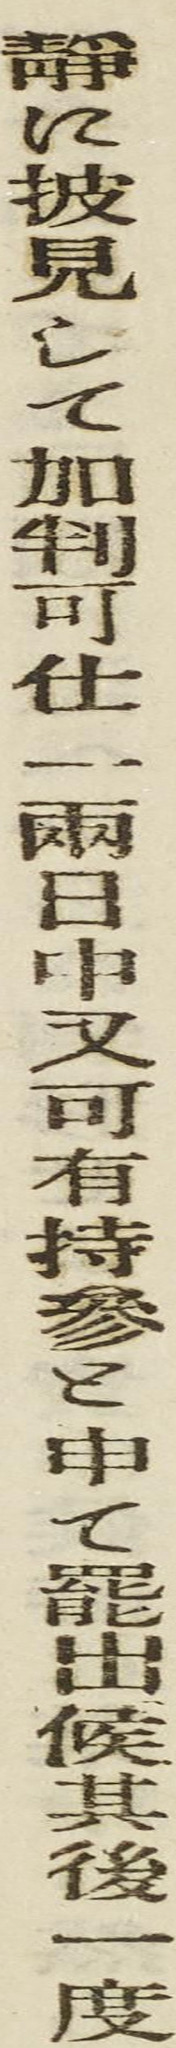静に披見して加判可仕一両日中又可有持参と申て罷出候其後一度
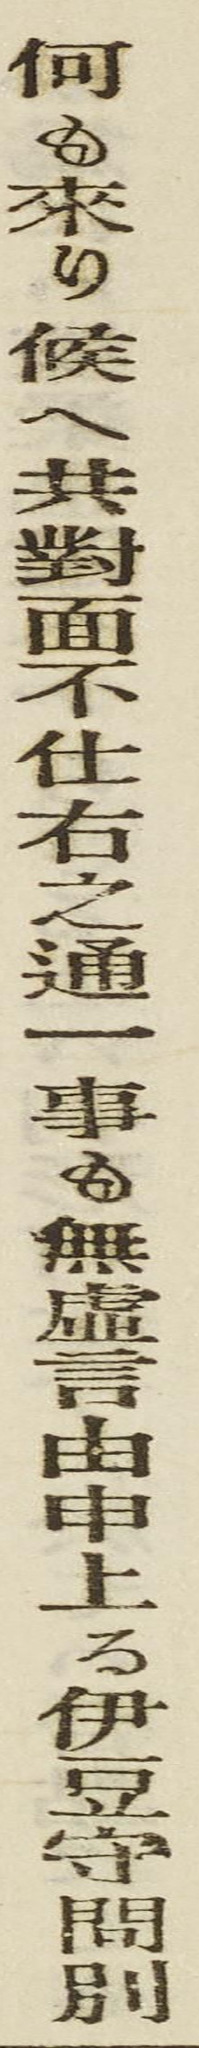何も来り候へ共対面不仕右之通一事も無虚言由申上る伊豆守問別
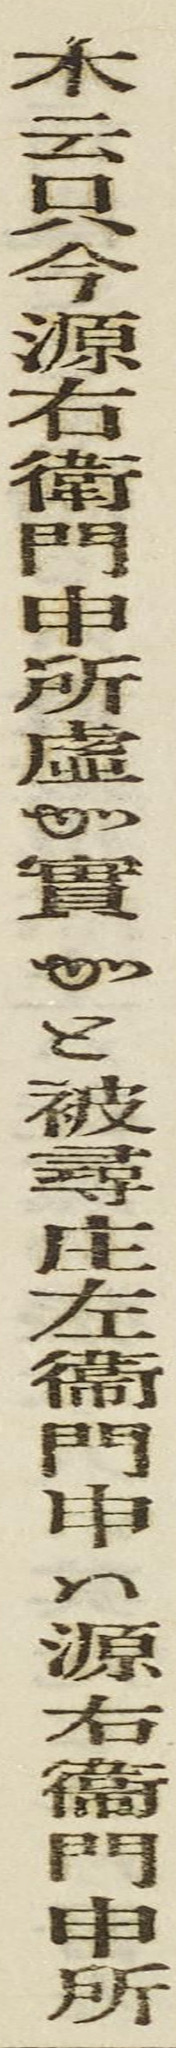木云只今源右衛門申所虚か実かと被尋庄左衞門申は源右衞門申所
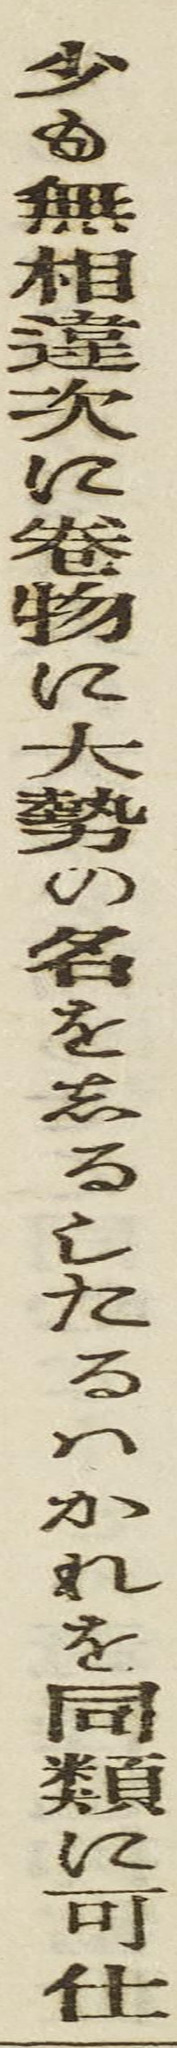少も無相違次に巻物に大勢の名をしるしたるはかれを同類に可仕
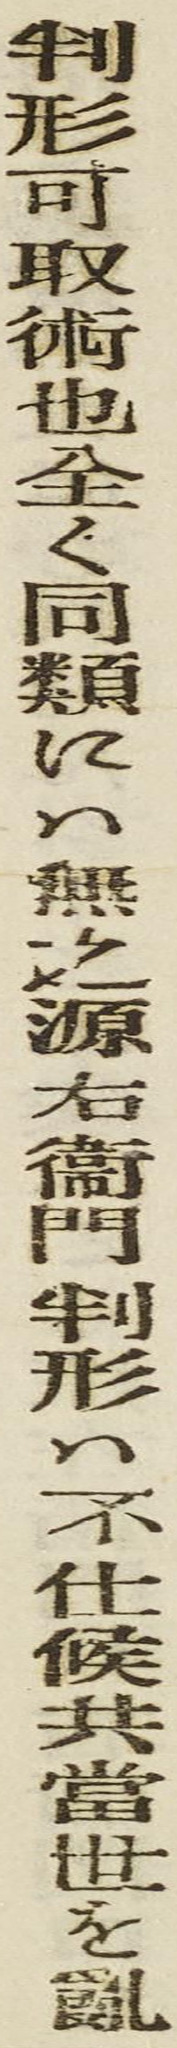判形可取術也全く同類には無之源右衞門判形は不仕候共当世を乱
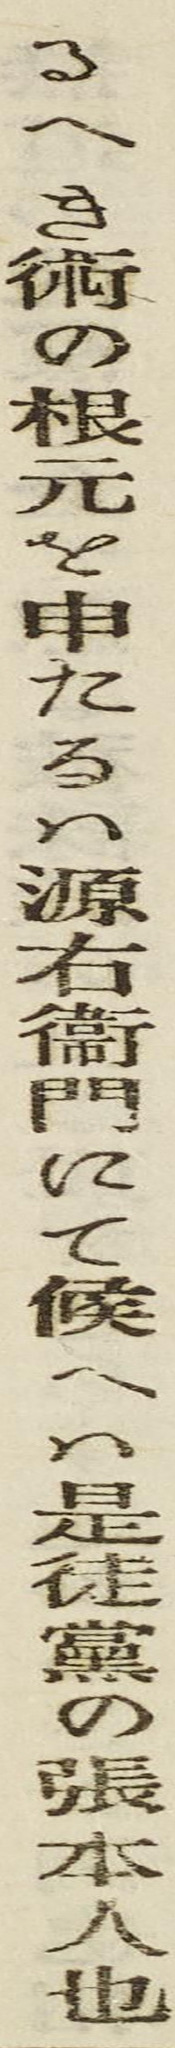るへき術の根元を申たるは源右衞門にて候へは是徒党の張本人也
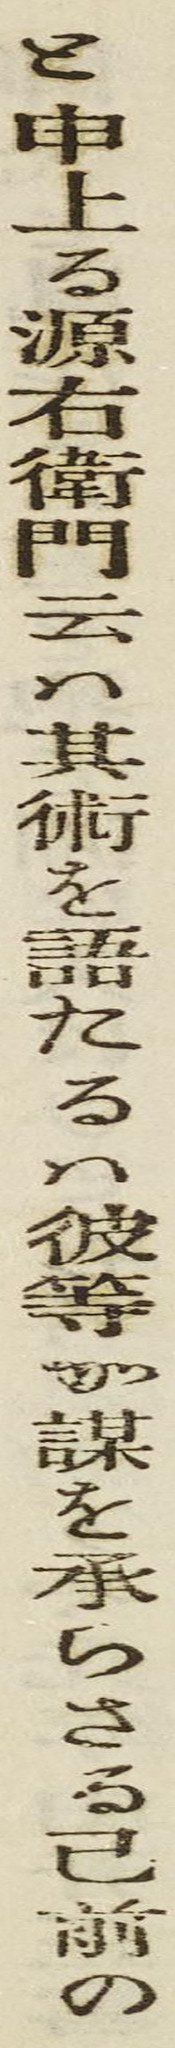と申上る源右衛門云は其術を語たるは彼等か謀を承らさる己前の
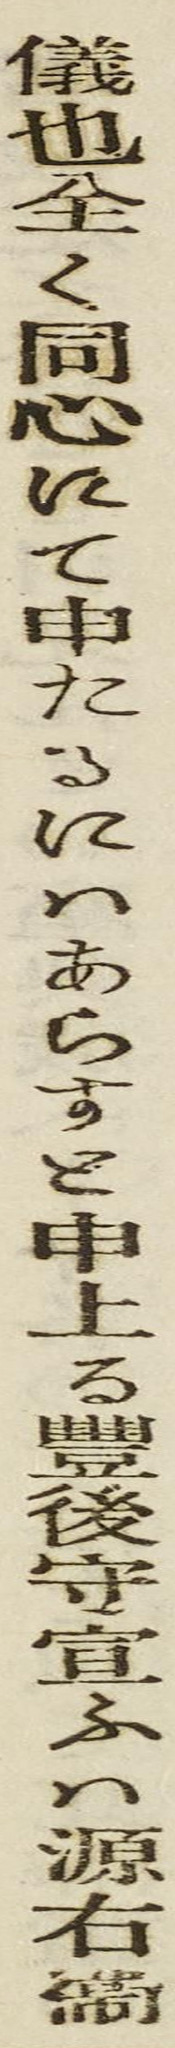儀也全く同心にて申たるにはあらすと申上る豊後守宣ふは源右衞
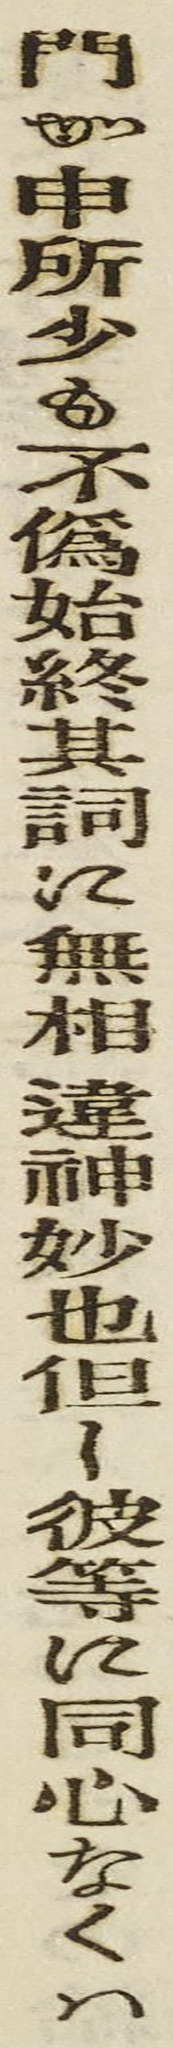門か申所少も不偽始終其詞に無相違神妙也但し彼等に同心なくは
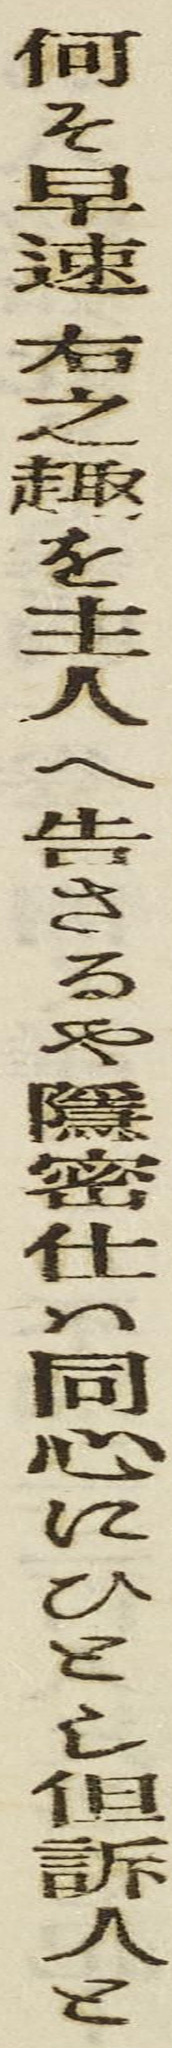何そ早速右之趣を主人へ告さるや隠密仕は同心にひとし但訴人と
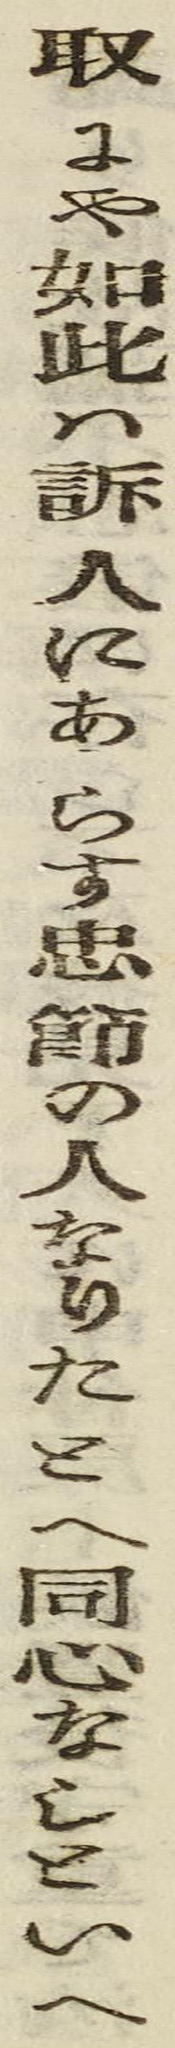取にや如此は訴人にあらす忠節の人なりたとへ同心なしといへ
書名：史籍集覽　朝鮮陣古文・細井廣澤記・颶風紀事・天明七年將軍宣下次第書　全
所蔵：東京大学地震研究所図書室 Earthquake Research Institute Library, The University of Tokyo, JAPAN
